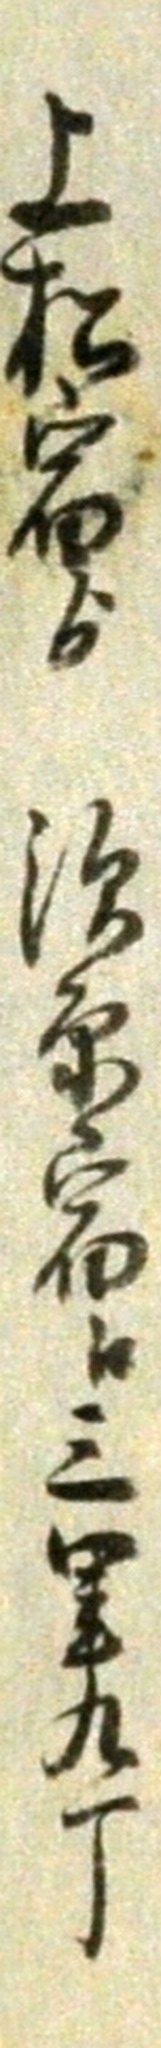上松宿ゟ須原宿江三里九丁
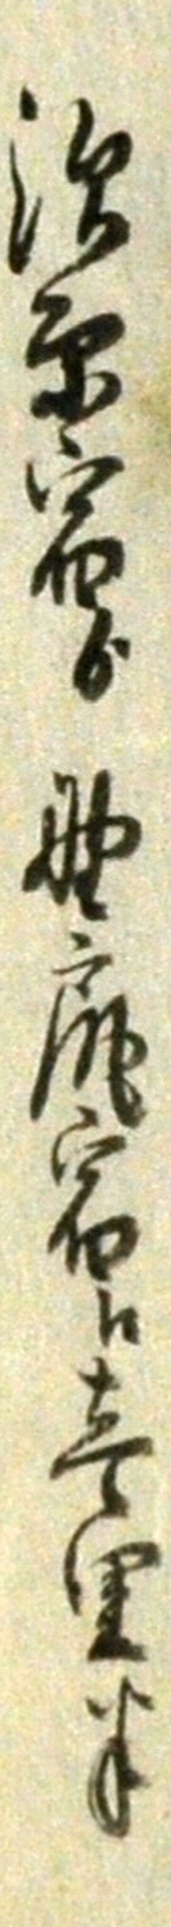須原宿ゟ野尻宿江壱里半
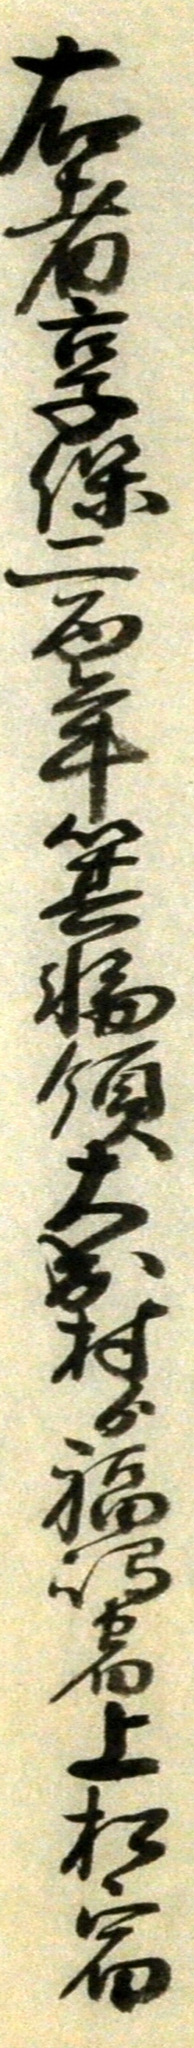右者享保二丙年箕輪領大出村ゟ福嶋宿上松宿
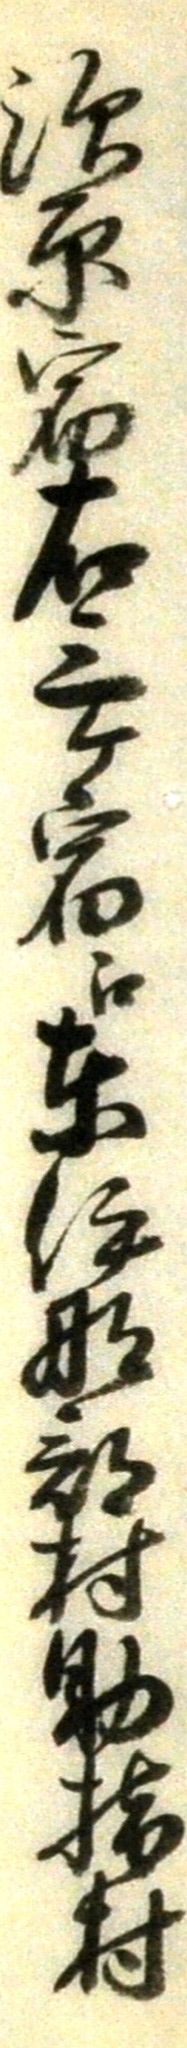須原宿右三ヶ宿江東伊那部村助指村
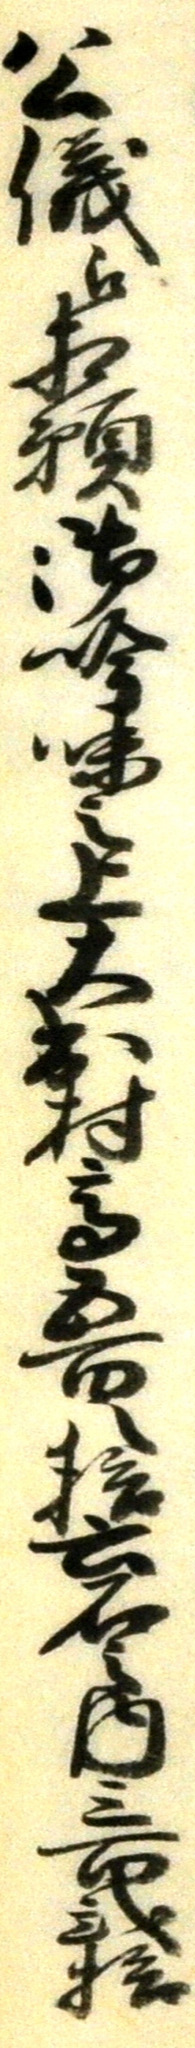公儀江相願御吟味之上大出村高五百八拾六石之内三百弐拾
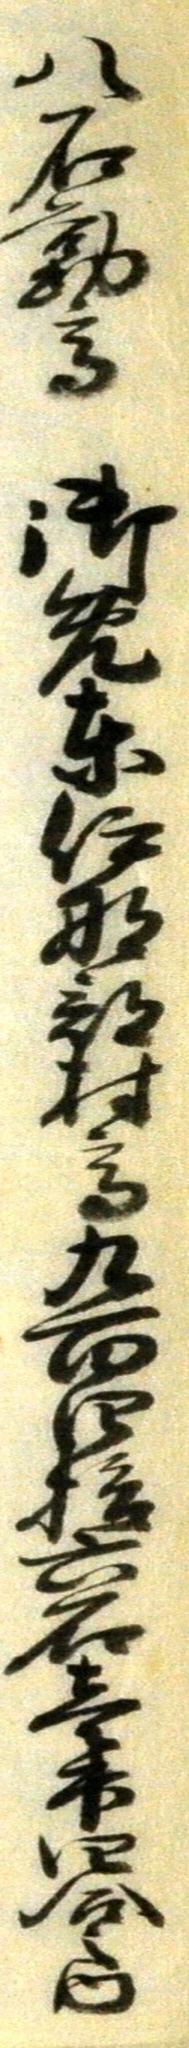八石勤高御免東伊那部村高九百四拾六石壱升四合之内
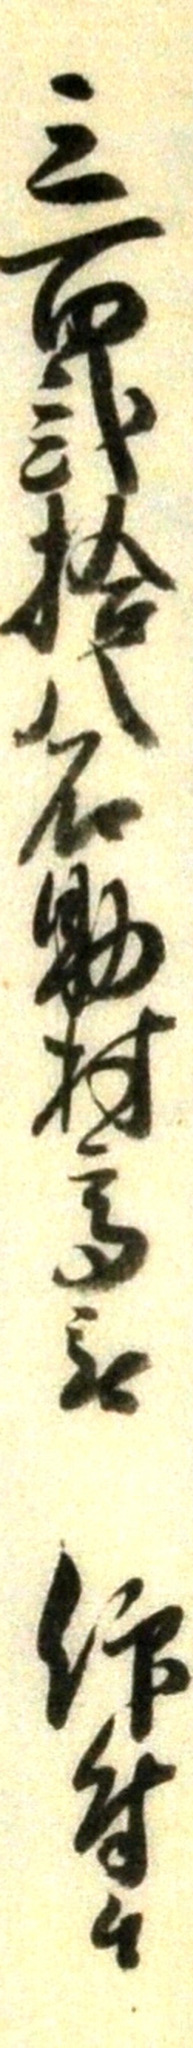三百弐拾八石助村高被仰付候
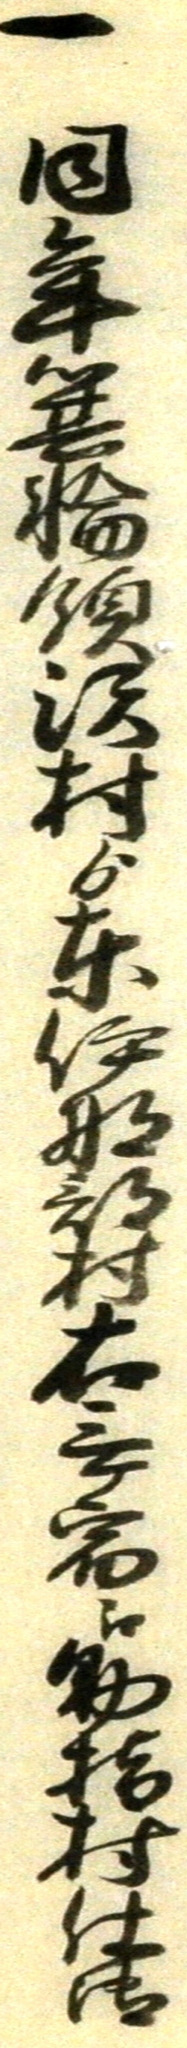一同年箕輪領沢村ゟ東伊那部村右三ヶ宿江助指村仕御
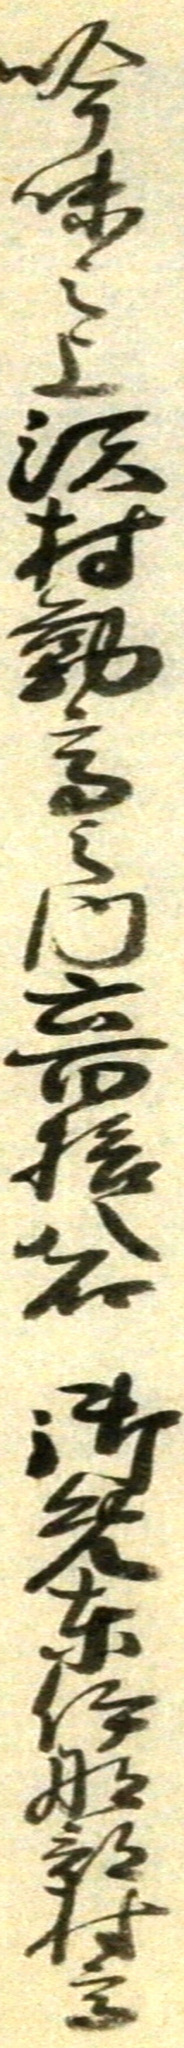吟味之上沢村勤高之内六百拾八石御免東伊那部村高
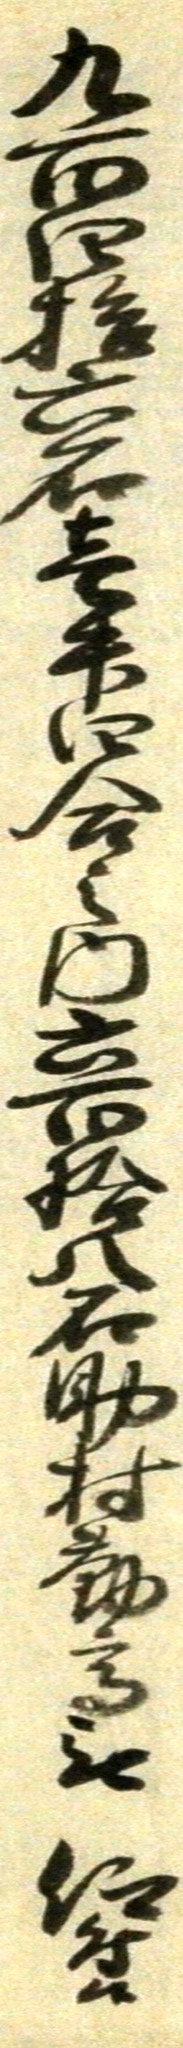九百四拾六石壱升四合之内六百拾八石助村勤高被仰付候
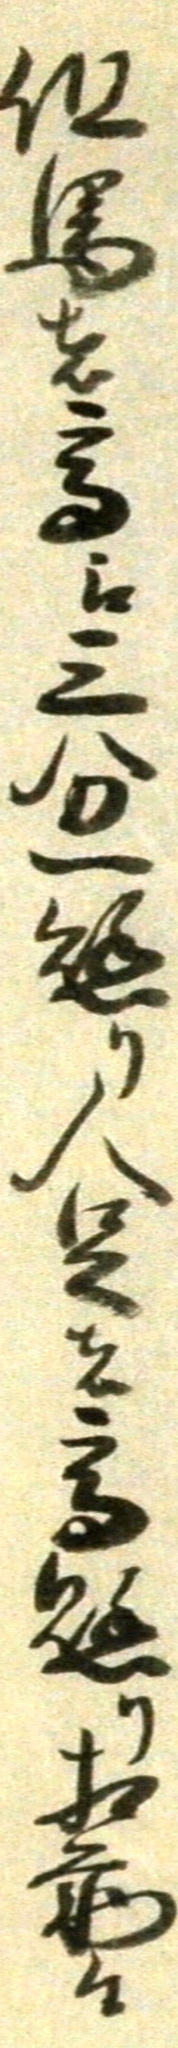但馬者高江三分一懸り人足者高懸り相勤候
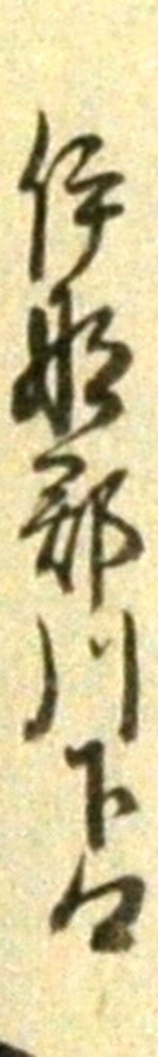伊那郡川下郷
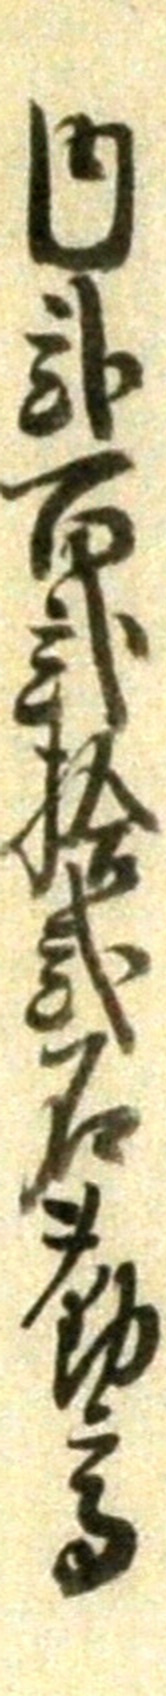内弐百弐拾弐石勤高
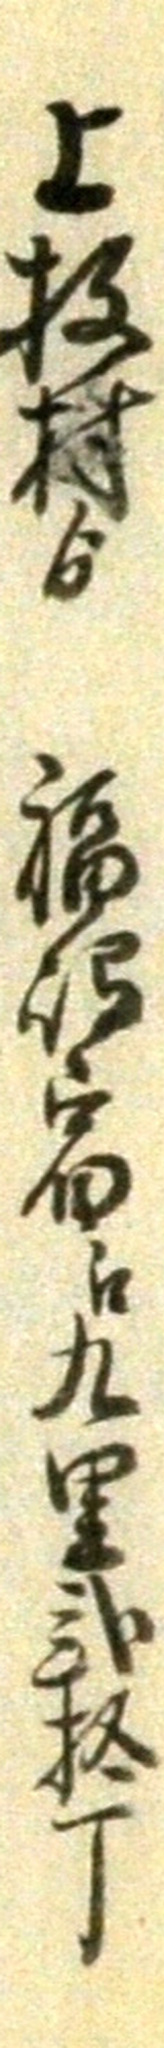上牧村ゟ福嶋宿江九里弐拾丁
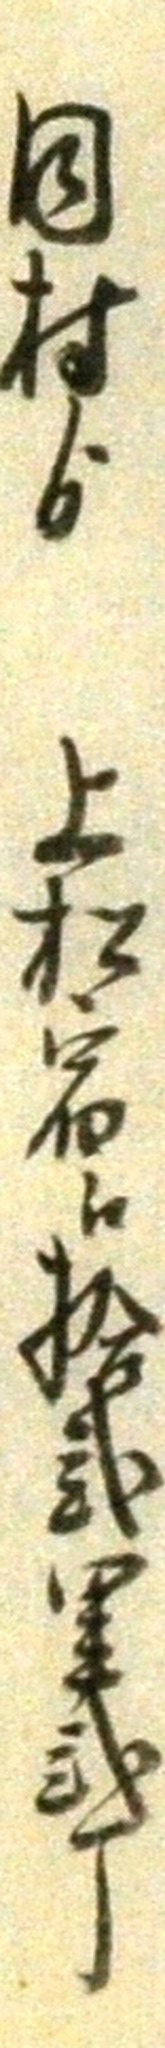同村ゟ上松宿江拾弐里弐丁
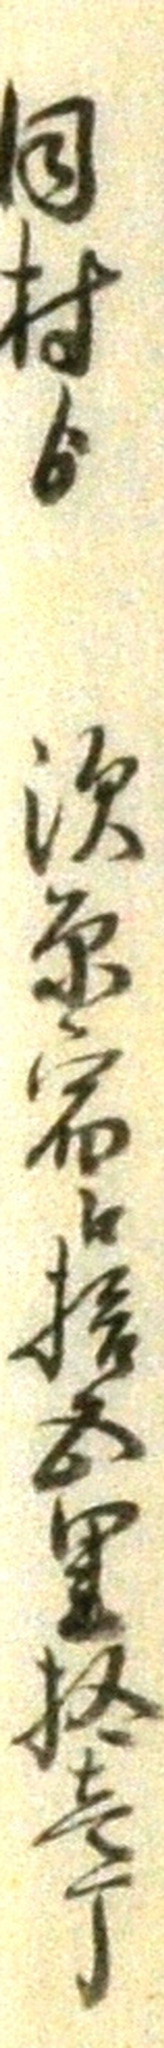同村ゟ須原宿江拾五里拾壱丁
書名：御領分拾九箇村木曽助并塩尻町・洗馬町・本山町へ人馬勤覚帳
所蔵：伊那市立高遠町図書館・合同会社AMANE
